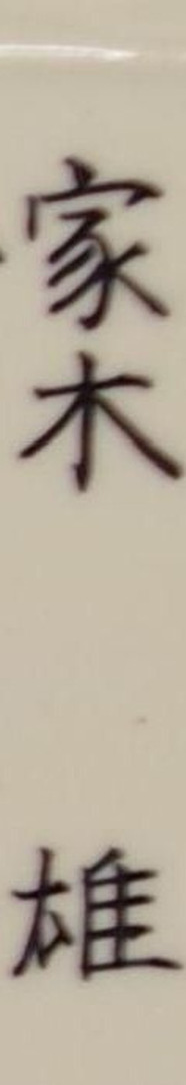家木雄
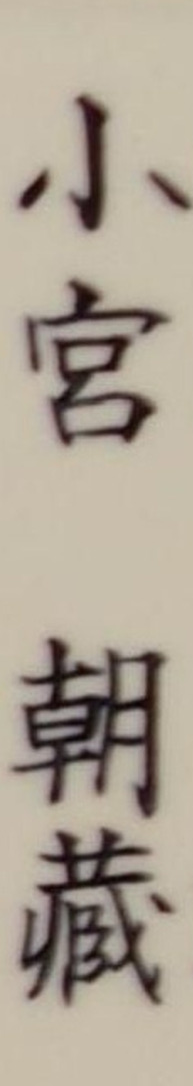小宮朝蔵
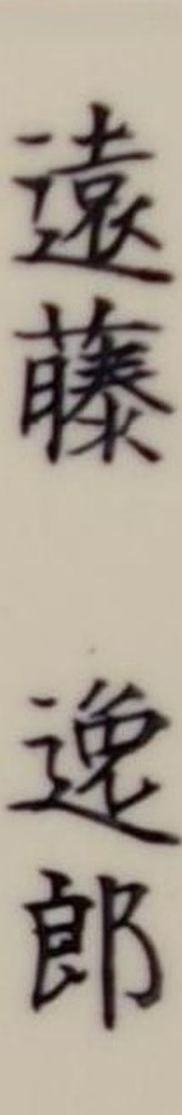遠藤逸郎
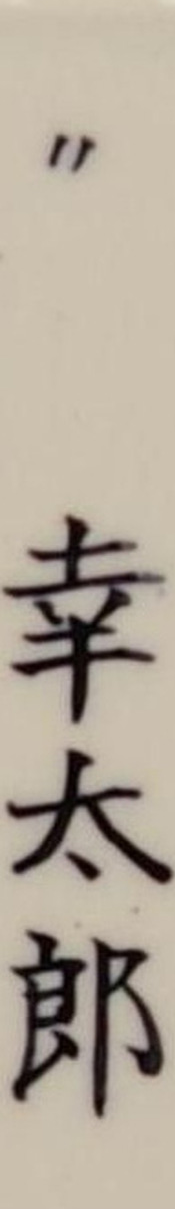幸太郎
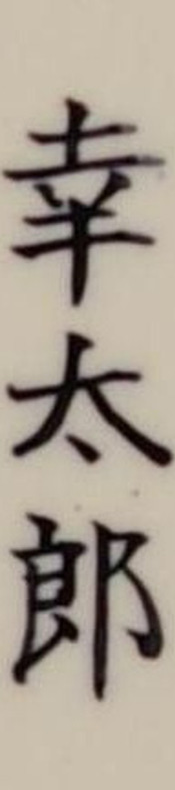幸太郎
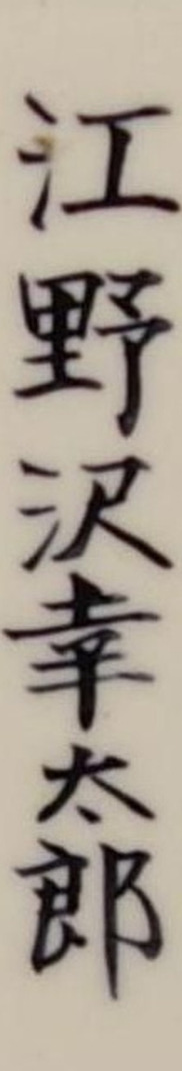江野沢幸太郎
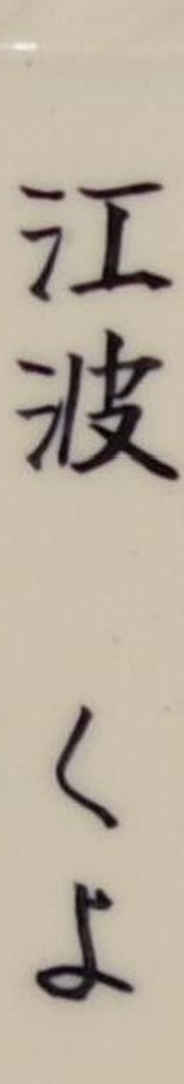江波くよ
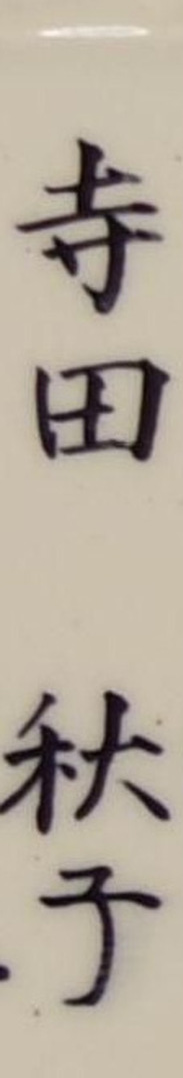寺田秋子
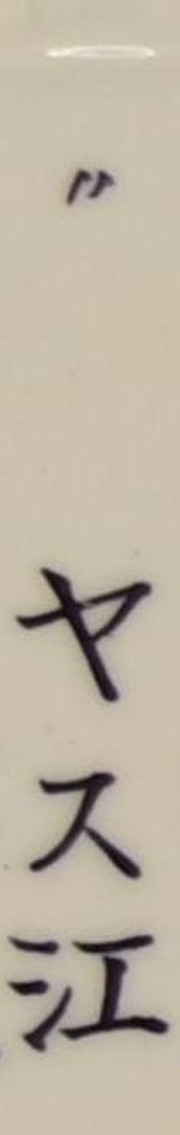ヤス江
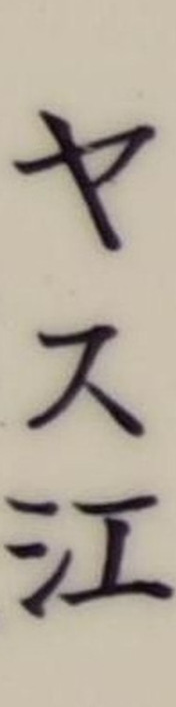ヤス江

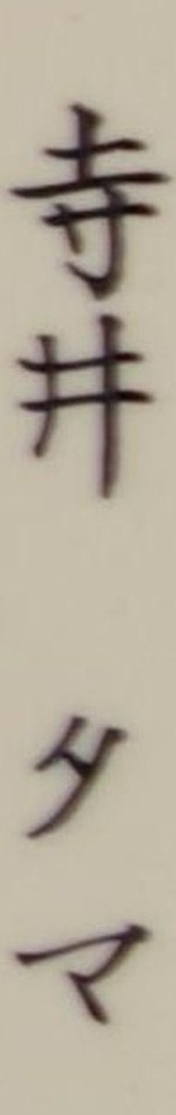寺井タマ
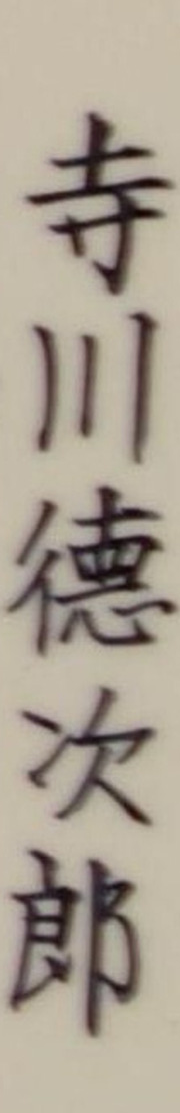寺川徳次郎
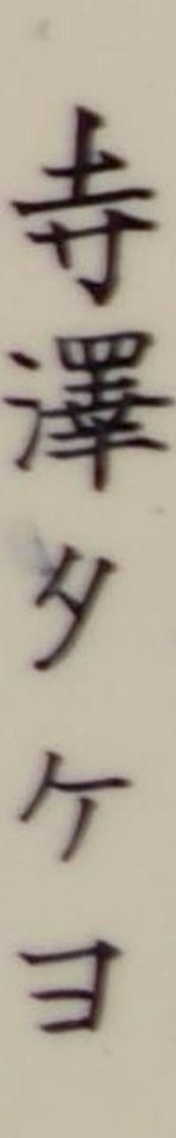寺澤タケヨ
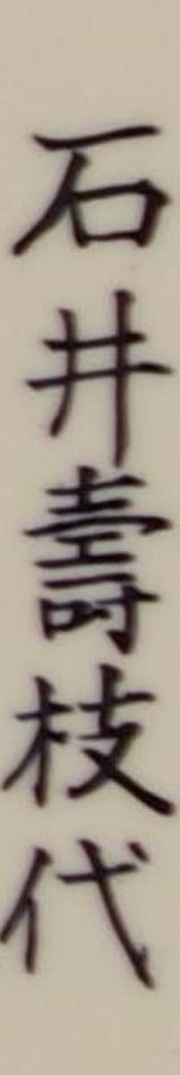石井壽枝代
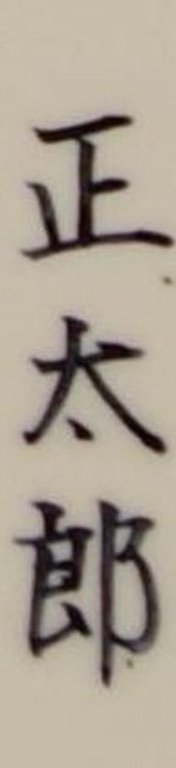正太郎
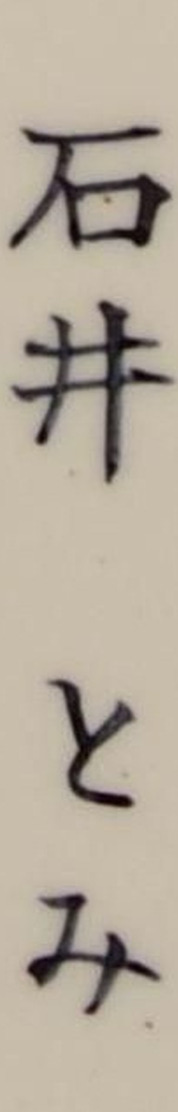石井とみ
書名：M~S
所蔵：高野山金剛峯寺
